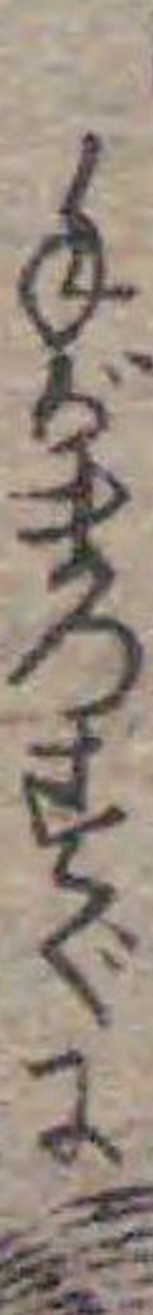てがまつすぐに
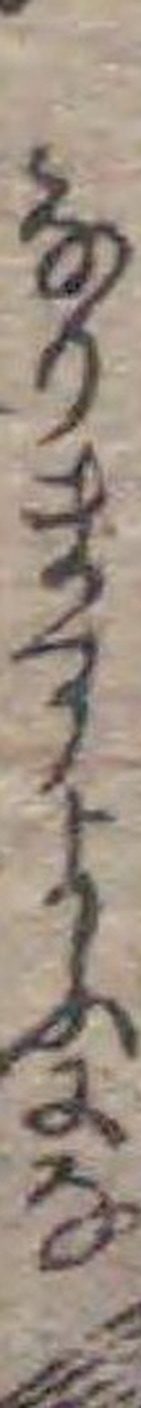なりますよふにな
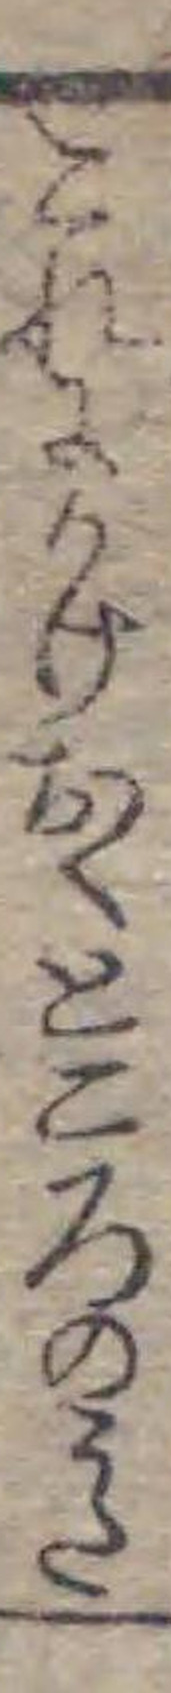これにかけおくところのうた
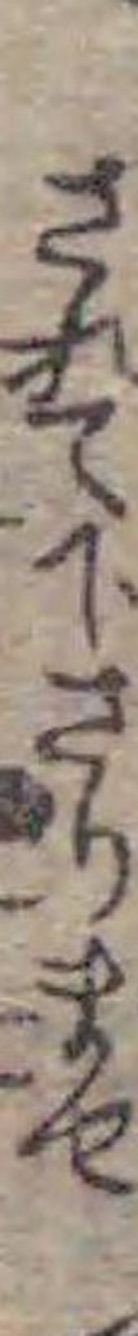されて下さりませ
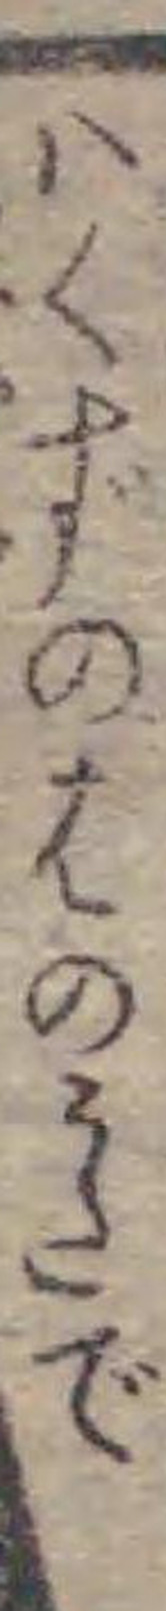はくずのはのうたで
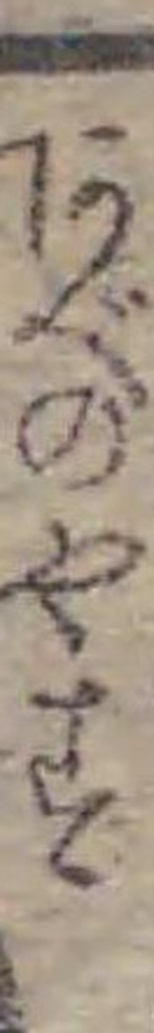あべのやす
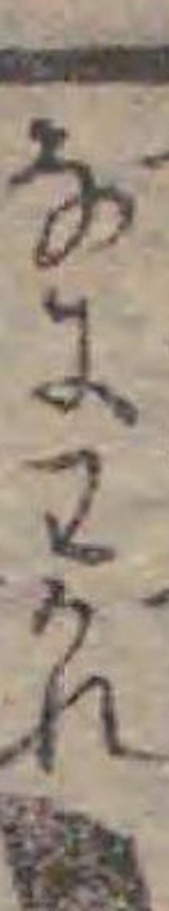なにわかれ
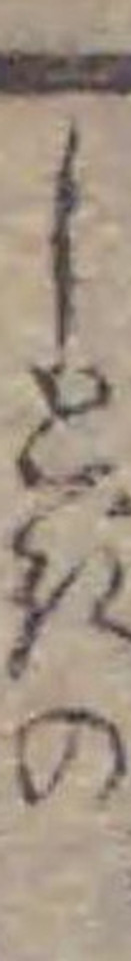しときの
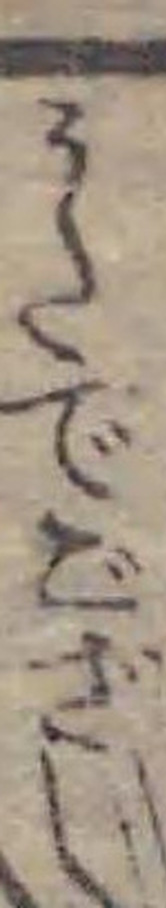うたでござ
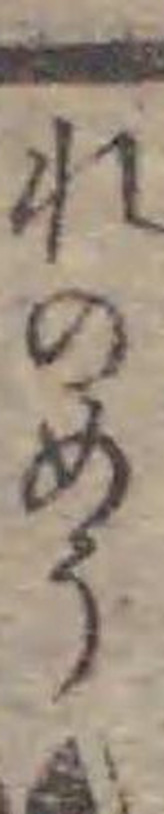れのめう
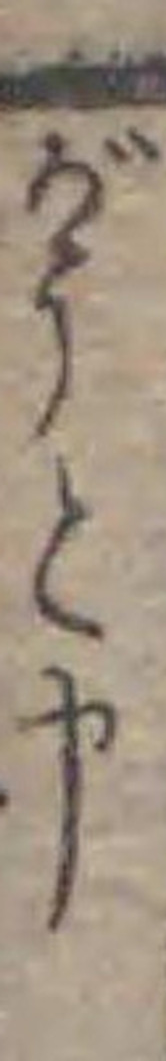がうと申
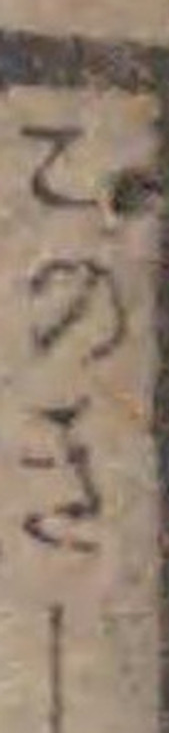このき
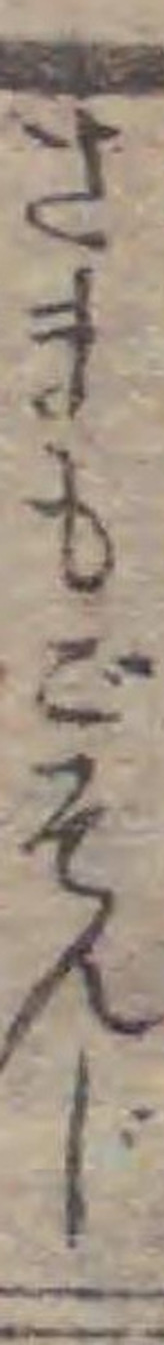さまもごぞんじ
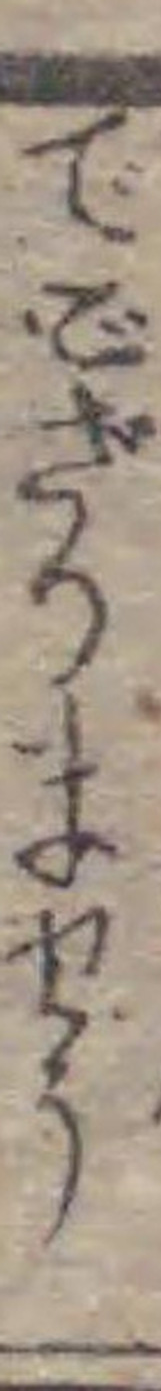でござりませう
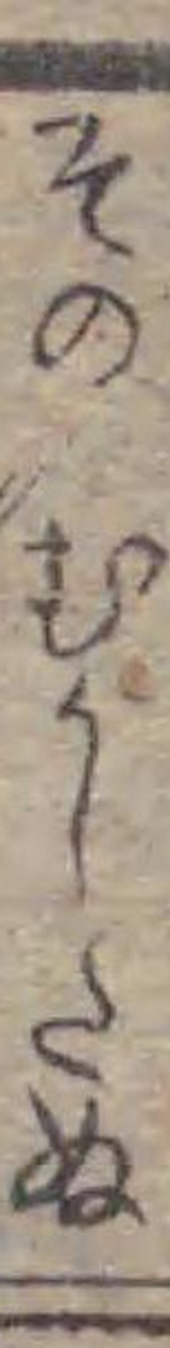そのむかしたぬ
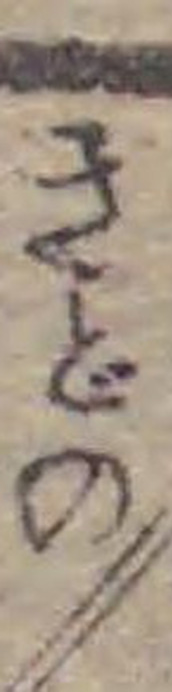きどの
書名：化物七段目 : 2巻
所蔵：国立国会図書館 National Diet Library, JAPAN
